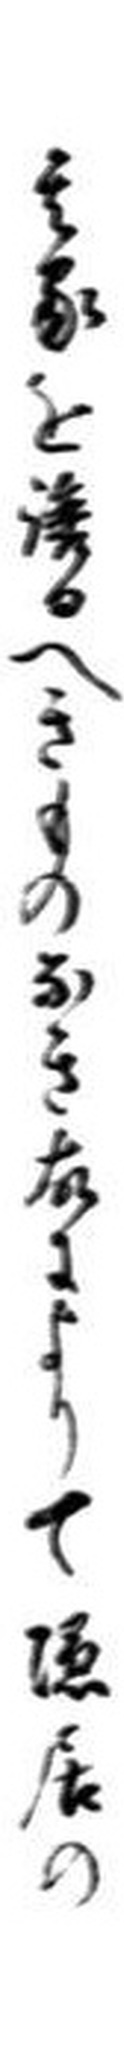其家を譲るへきものなき故によりて隠居の
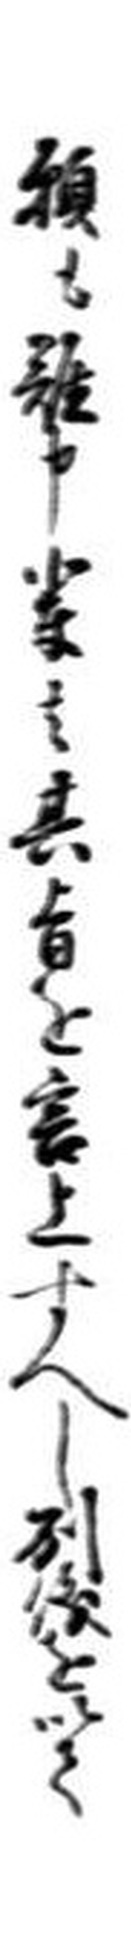願も難申輩者其旨を言上すへし別儀を以て

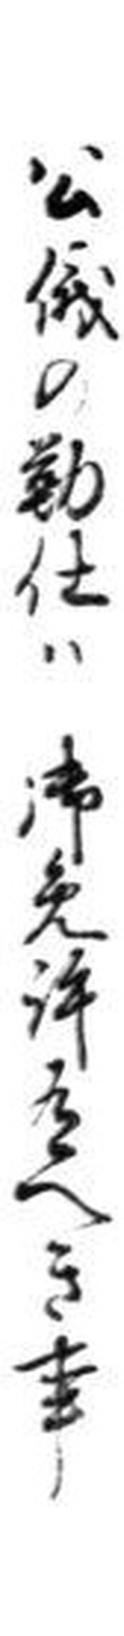公儀の勤仕ハ御免許有へき事
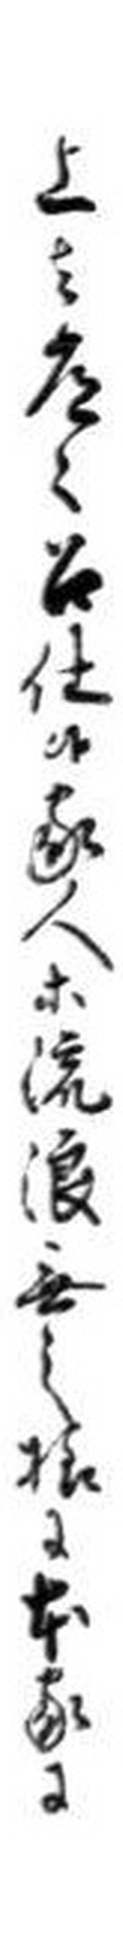上者常々召仕候家人等流浪無之様に本家に
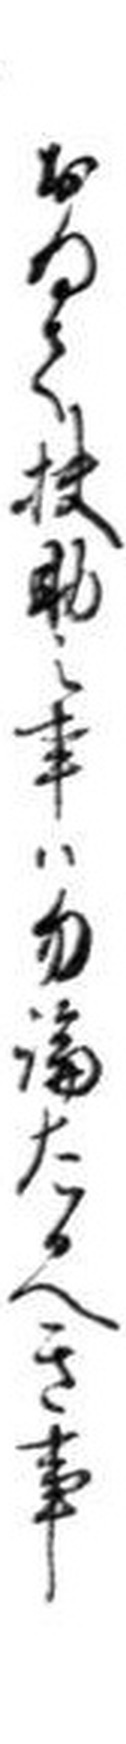おゐて扶助之事ハ勿論たるへき事
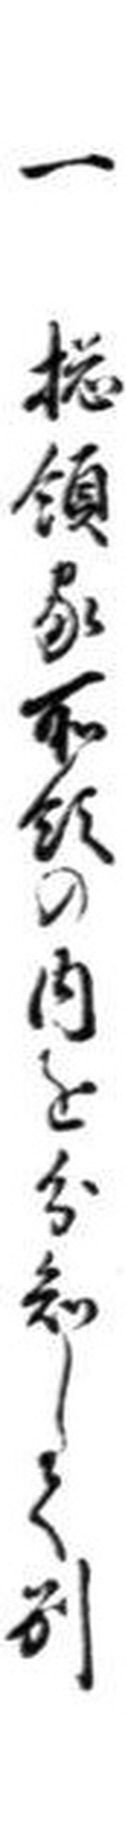一総領家所領の内を分知して別
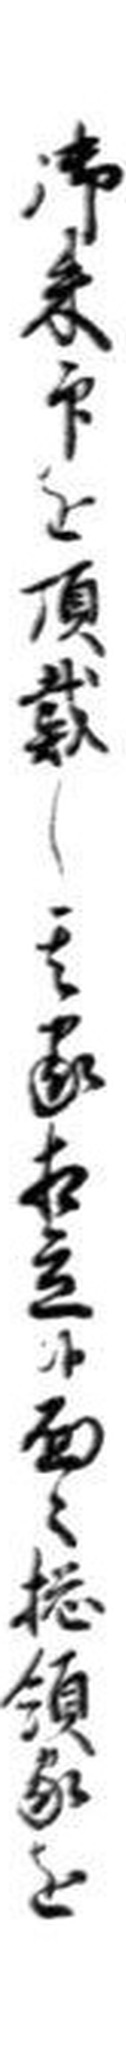御朱印を頂戴し其家相立候面々総領家を
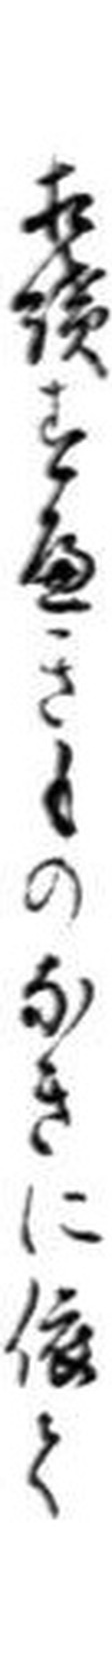相続すへきものなきに依て
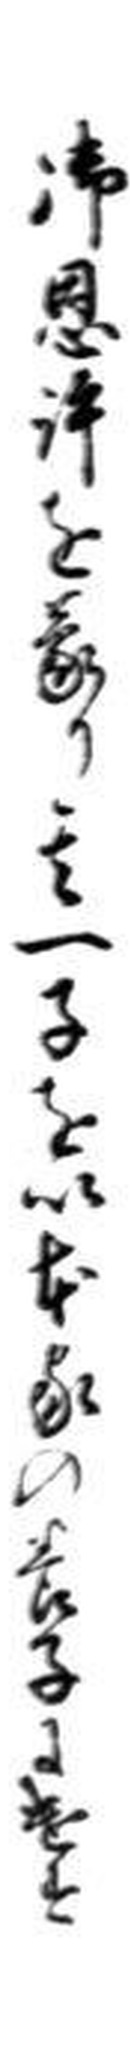御恩許を蒙り其一子を以本家の養子に遣す
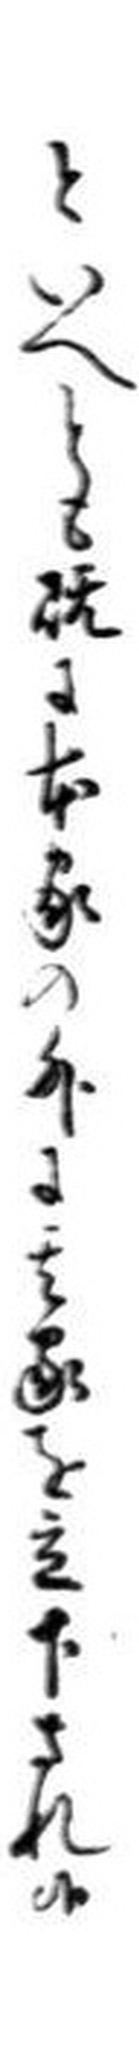といへとも既に本家の外に其家を立下され候
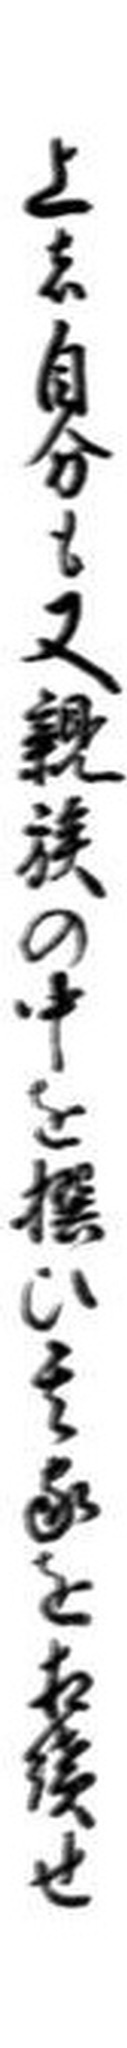上者自分も又親族の中を撰ひ其家を相続せ
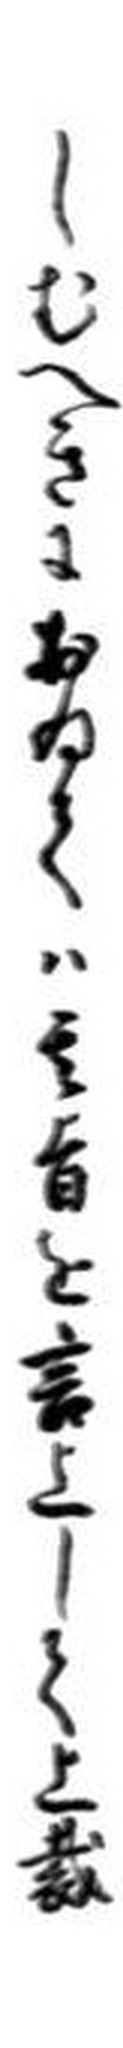しむへきにおゐてハ其旨を言上して上裁
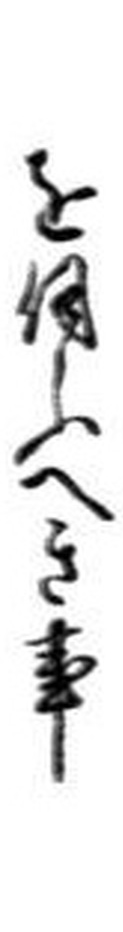を伺ふへき事
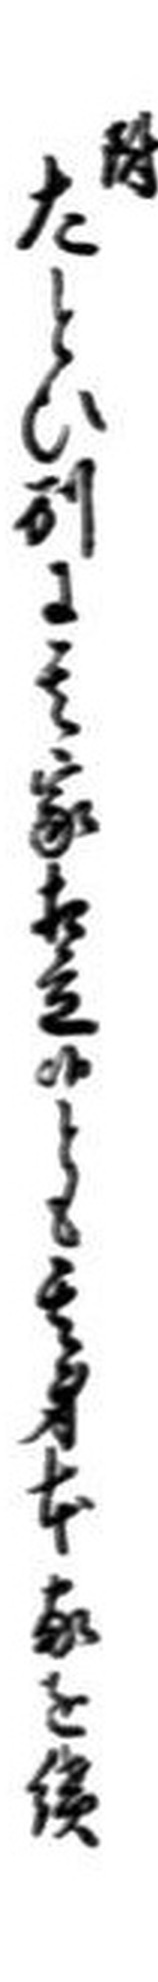たとひ別に其家相立候とも其身本家を続
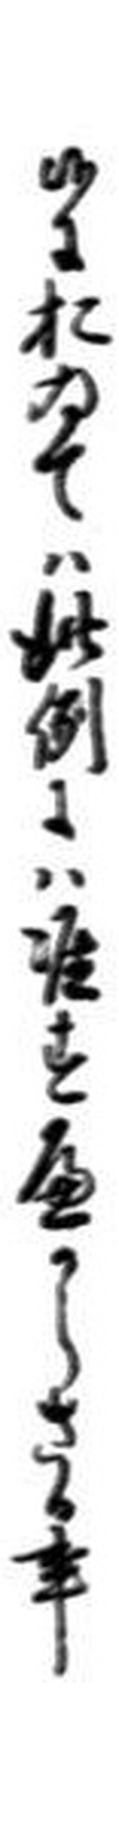候におゐては此例にハ准すへからさる事
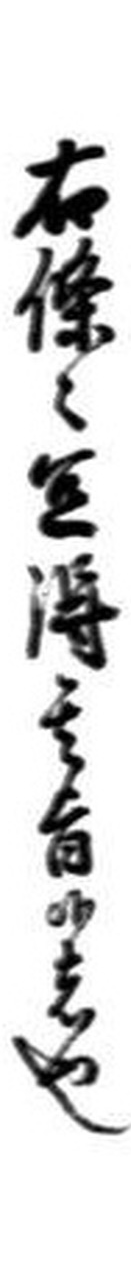右条々宜得其旨候者也
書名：家譜 三十一 吉邦公 享保元年
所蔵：福井県文書館 Fukui Prefectural Archives
